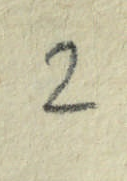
2
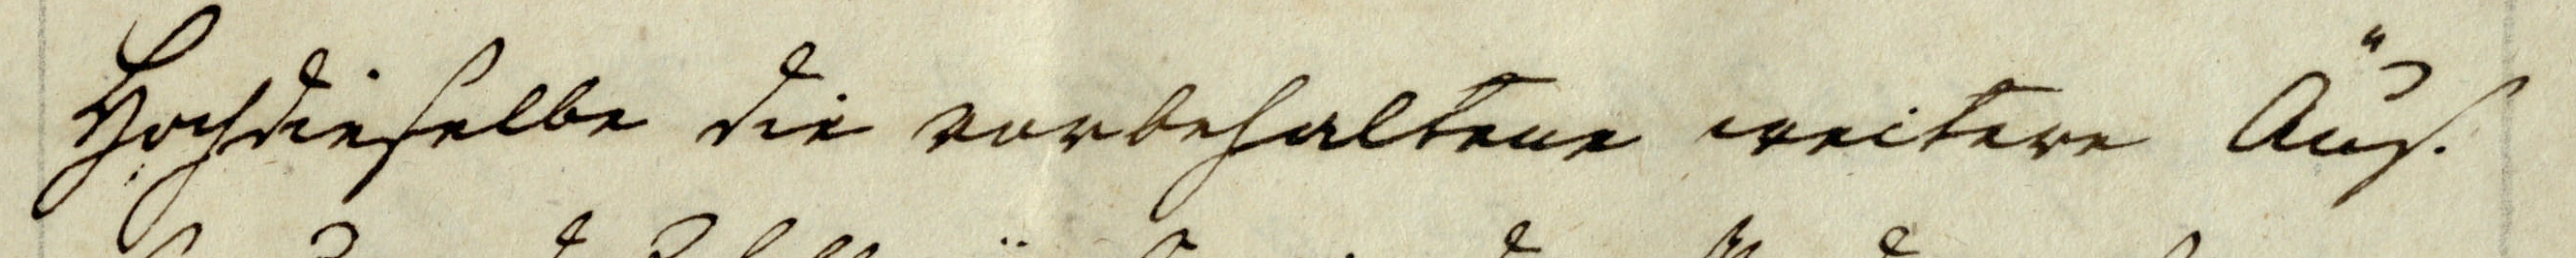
Hochdieselbe die vorbehaltene weitere Äus¬
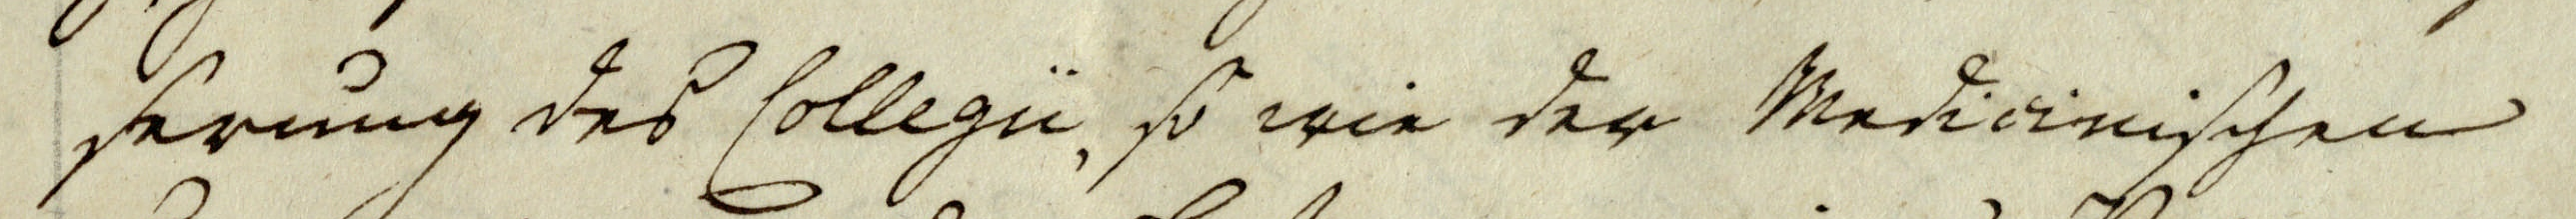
serung des Collegii, so wie der Medicinischen
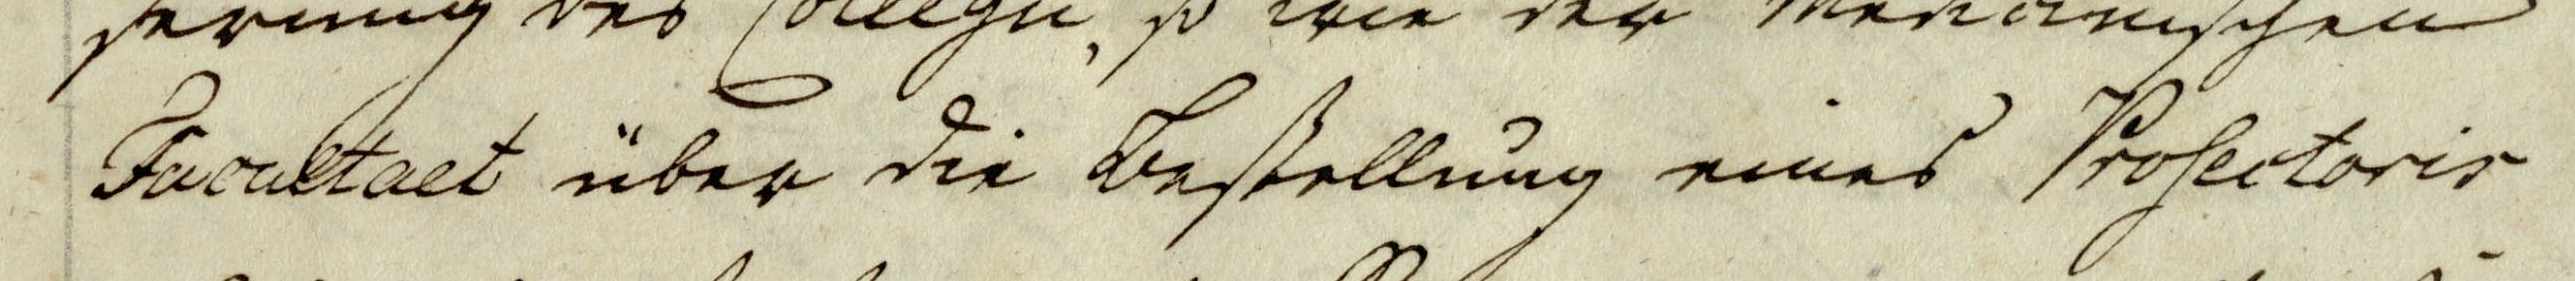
Facultaet über die Bestellung eines Protectoris
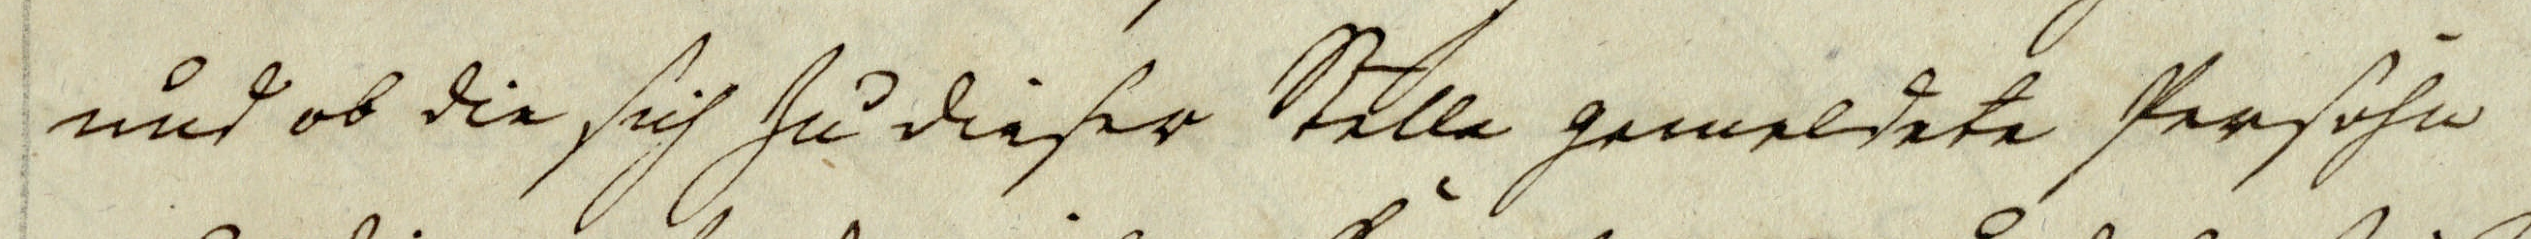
und ob die sich zu dieser Stelle gemeldete Persohn
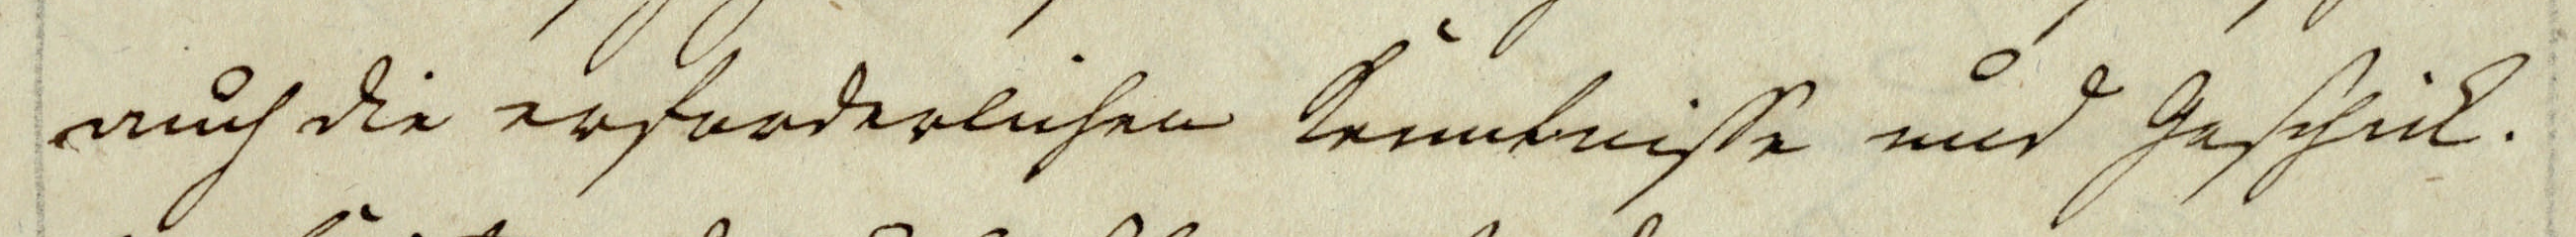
auch die erforderlichen Kenntnisse und Geschick¬
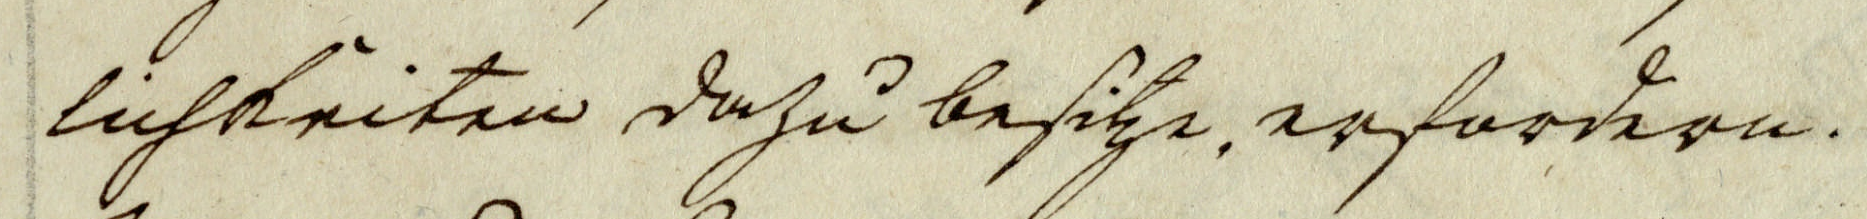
lichkeiten dazu besitzt, erfordern.
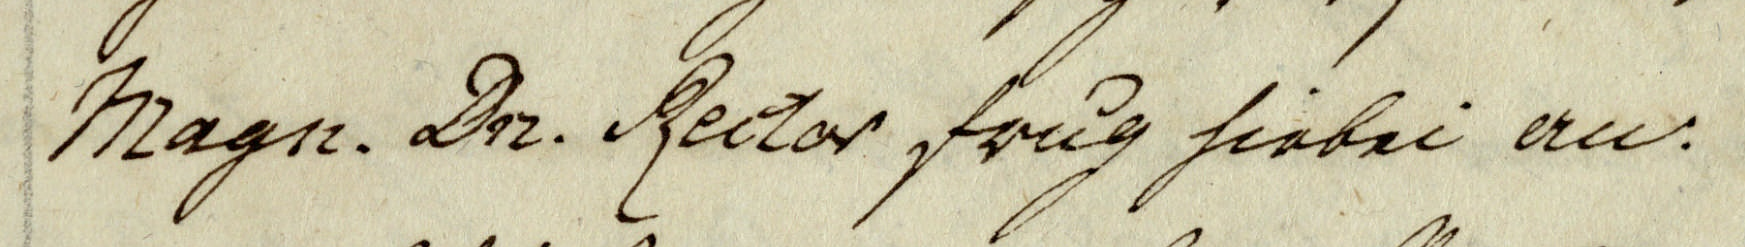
Magn. Dn. Rector frug hiebei an:
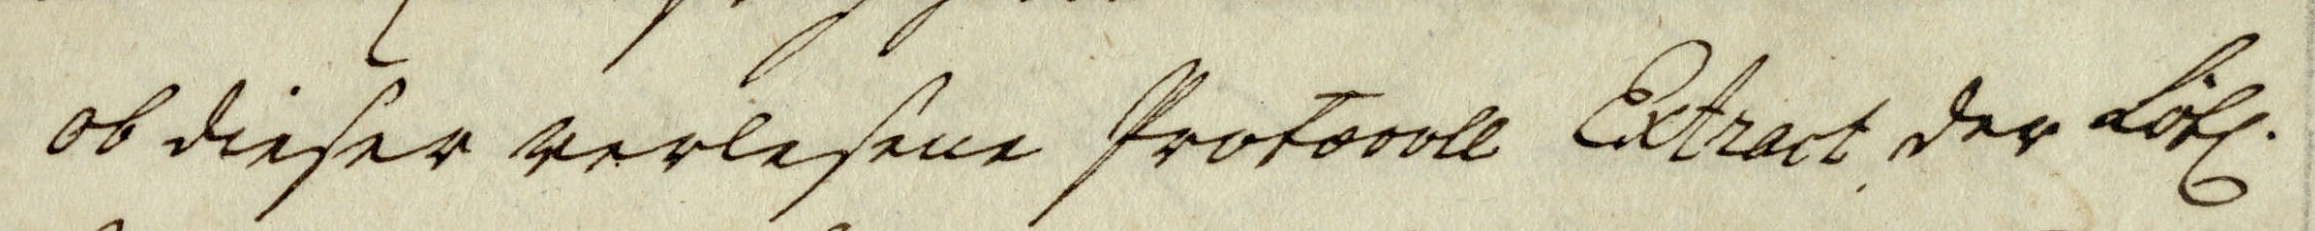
ob dieser verlesene Protocoll Extract der Löbl.
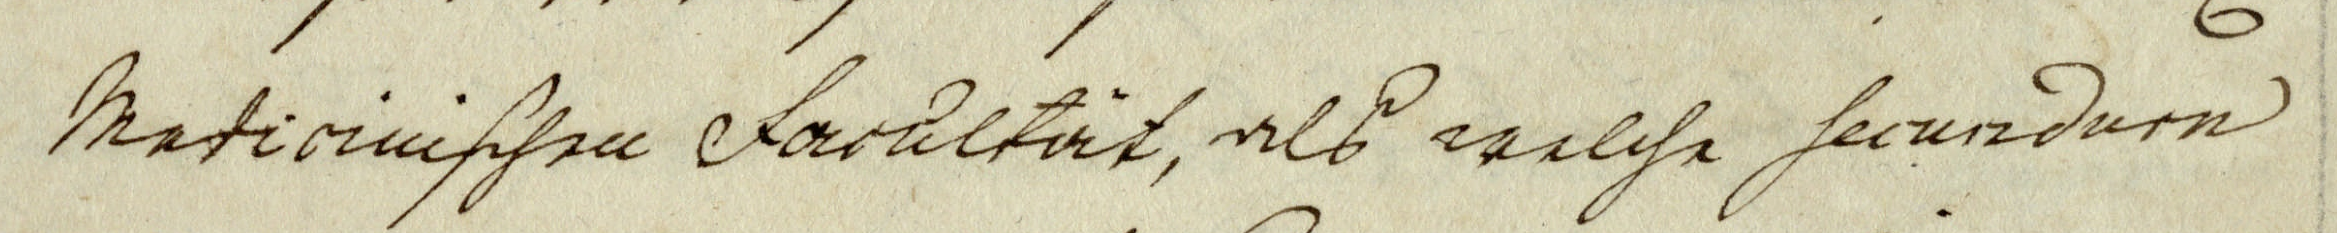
Medicinischen Facultät, als welche secundum
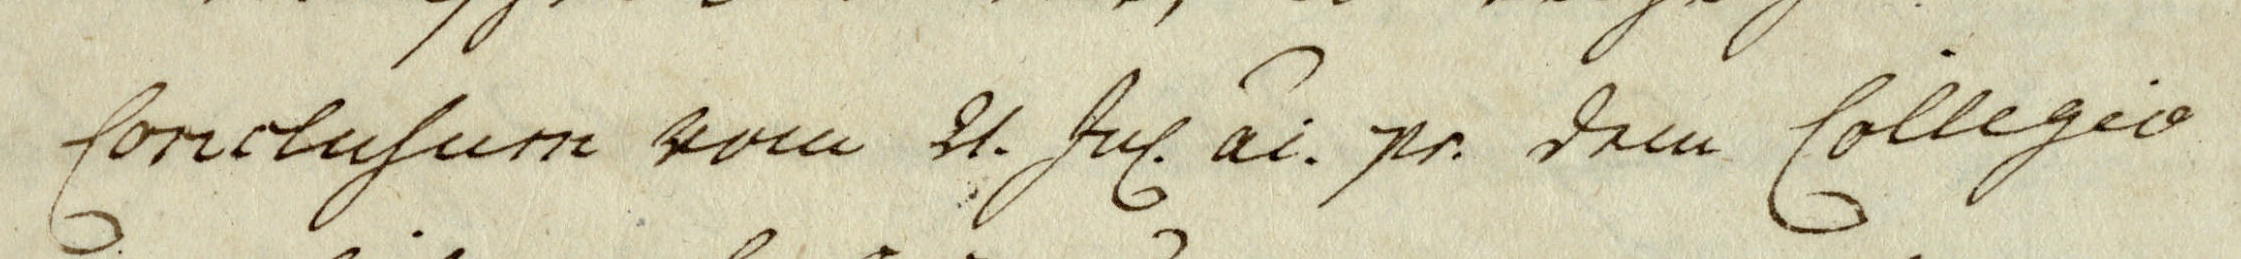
Conclusum vom 21. Jul. ai. pr. dem Collegio
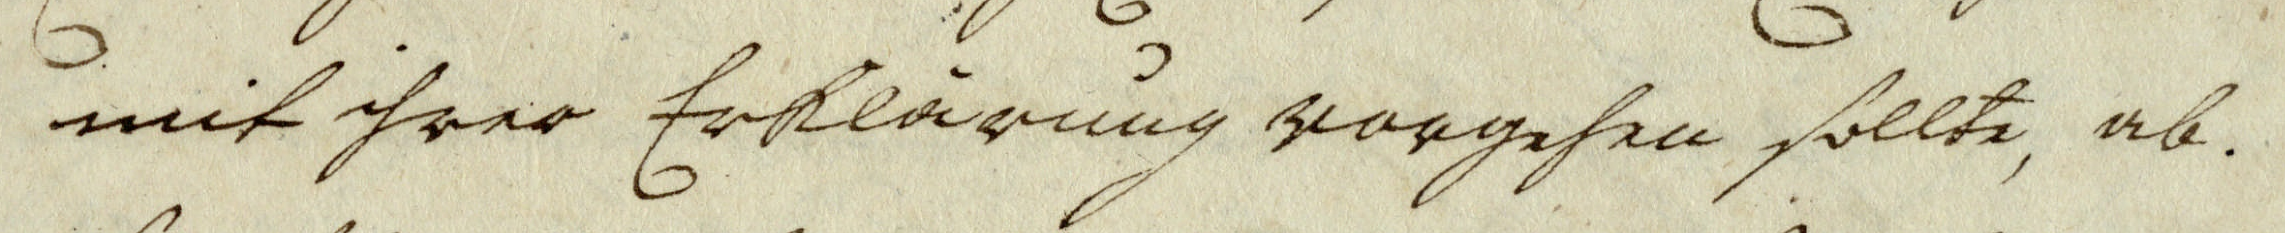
mit ihrer Erklärung vorgehen sollte, ab¬
